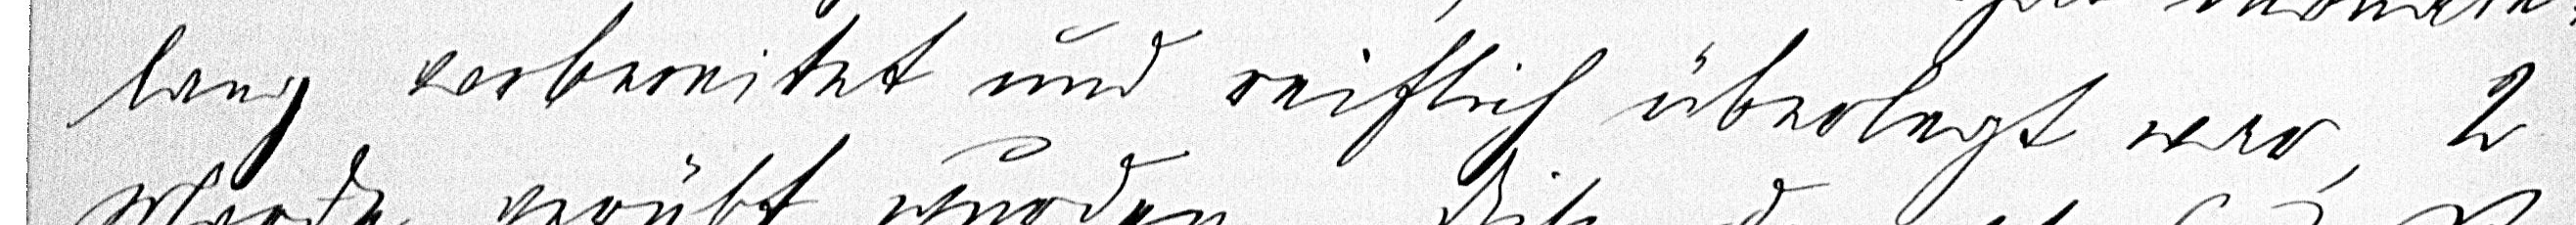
lang vorbereitet und reiflich überlegt war, 2
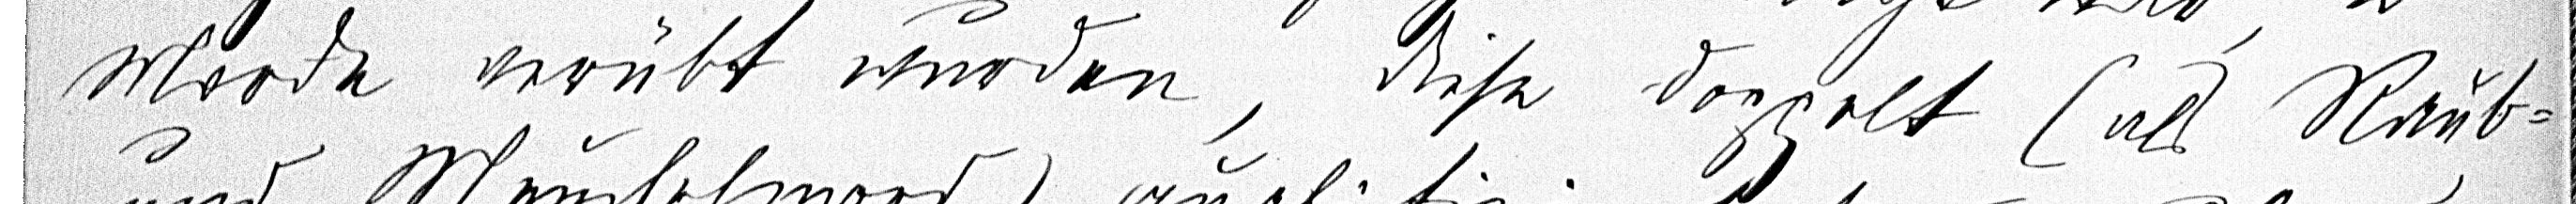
Morde verübt wurden, diese doppelt (als Raub-
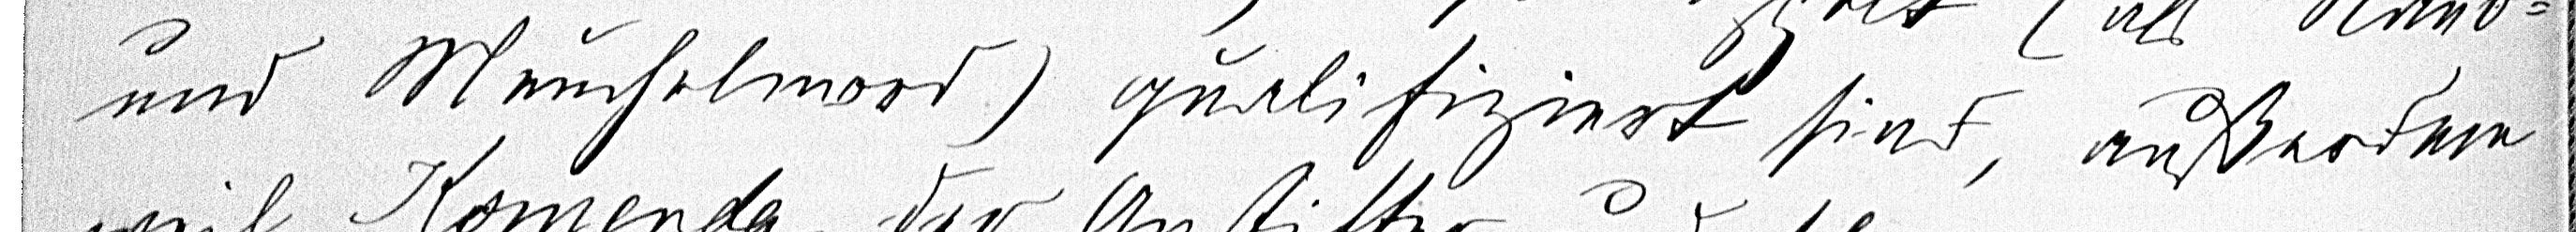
und Meuchelmord) qualifiziert sind, außerdem
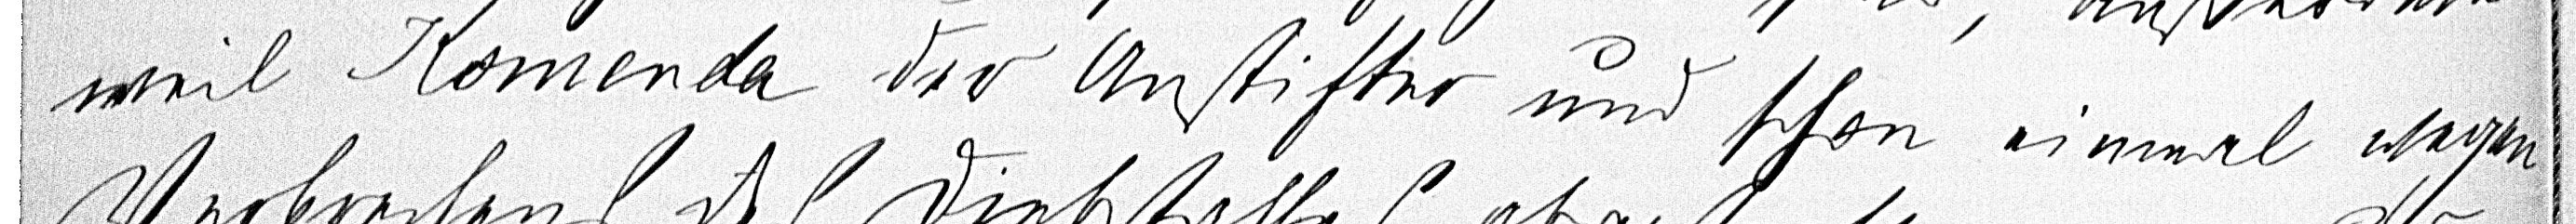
weil Komenda der Anstifter und schon, einmal wegen
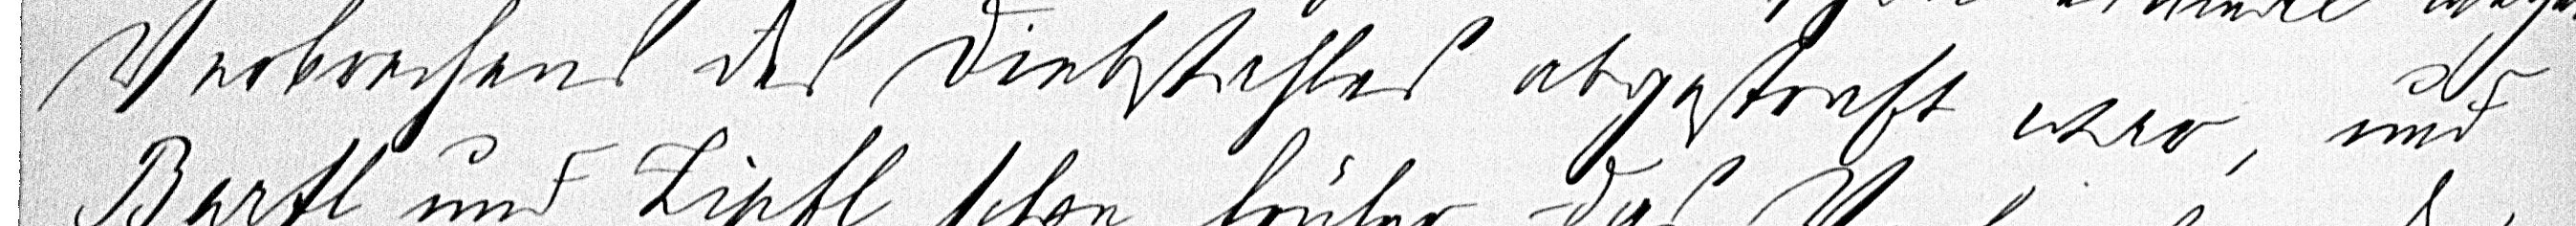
Verbrechens des Diebstahles abgestraft war, und
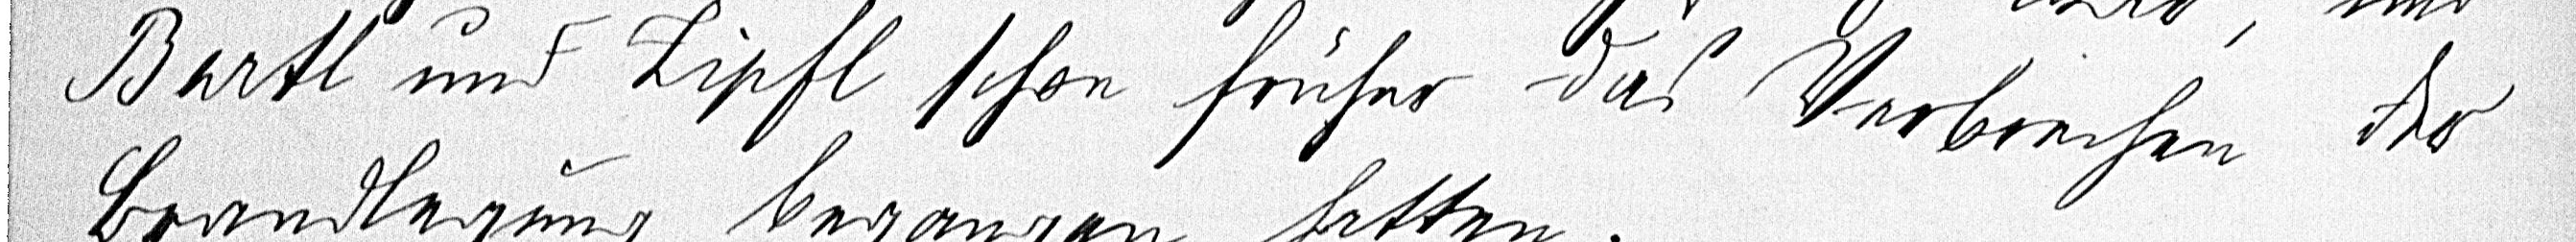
Bartl und Zipfl schon früher das Verbrechen der
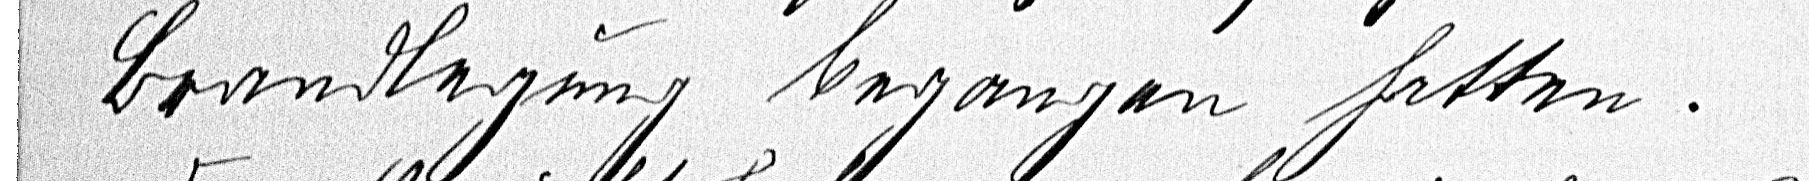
Brandlegung begangen hatten.
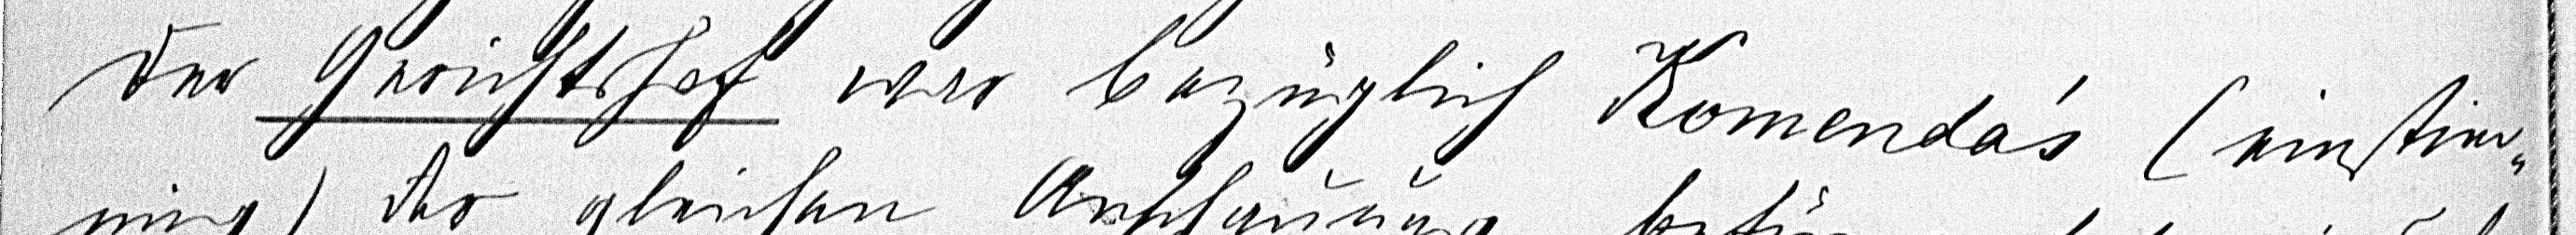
Der Gerichtshof war bezüglich Komendás (einstim¬
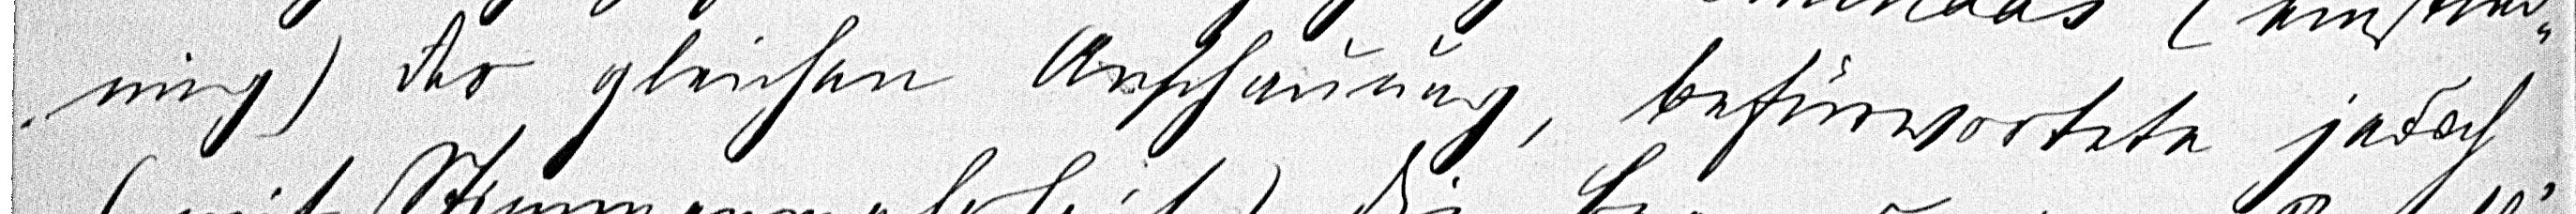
mig) der gleichen Anschauung, befürwortete jedoch
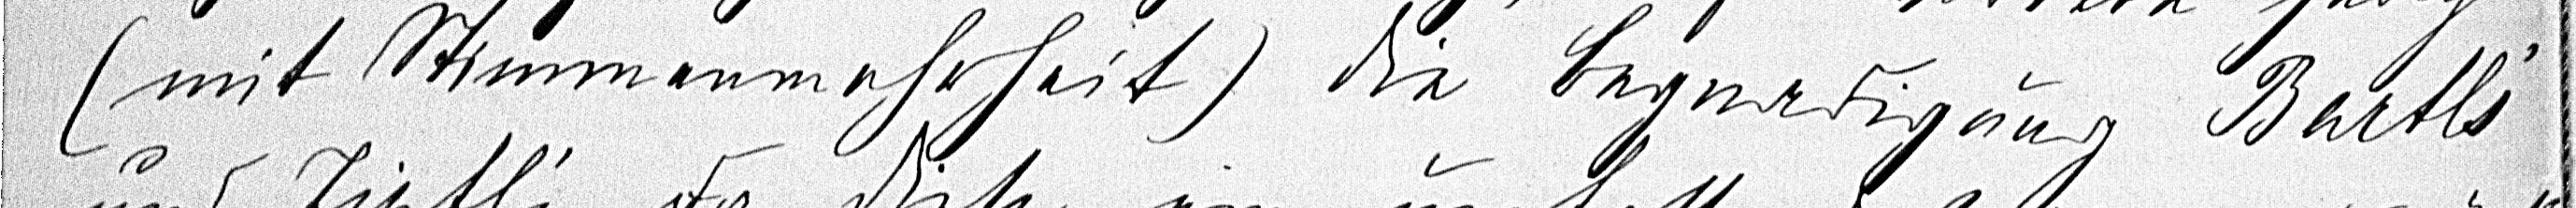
(mit Stimmenmehrheit) die Benadigung Bartl's
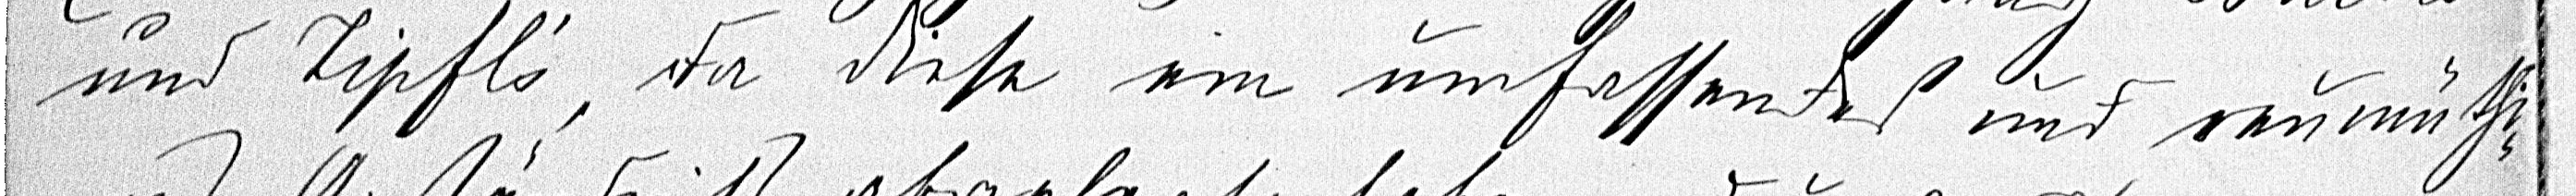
und Tipfl's, da diese ein unfassendes und reumüthi¬
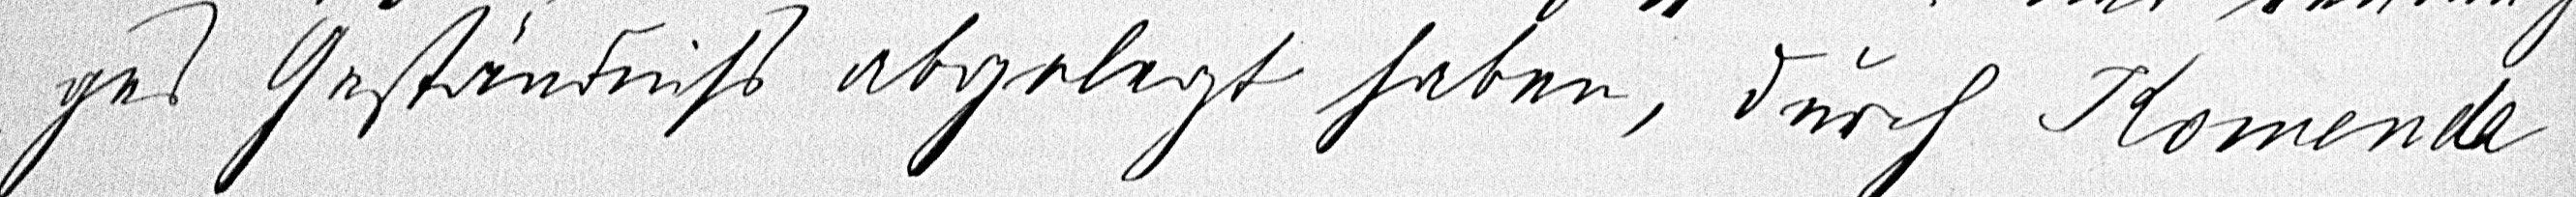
ges Geständniss abgelegt haben, durch Komenda
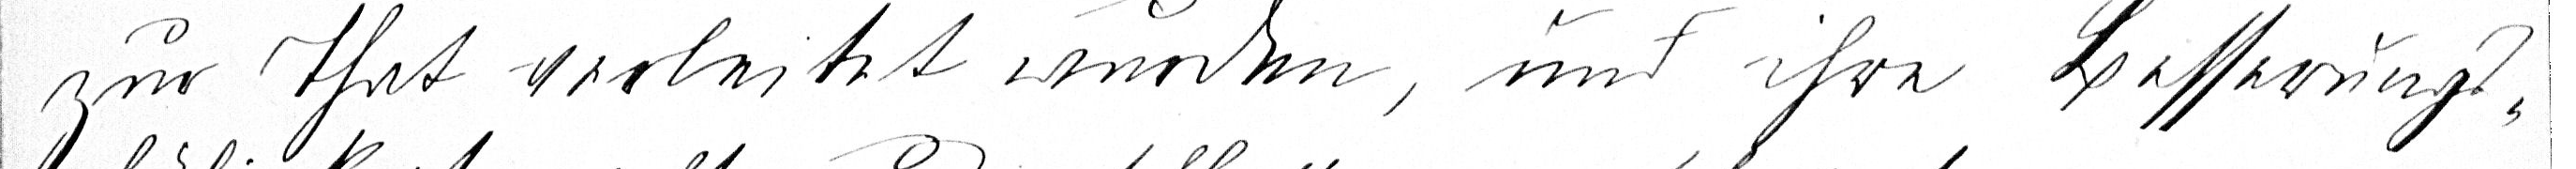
zur That verleitet wurden, und ihre Besserungs¬
